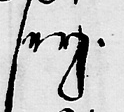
sey.
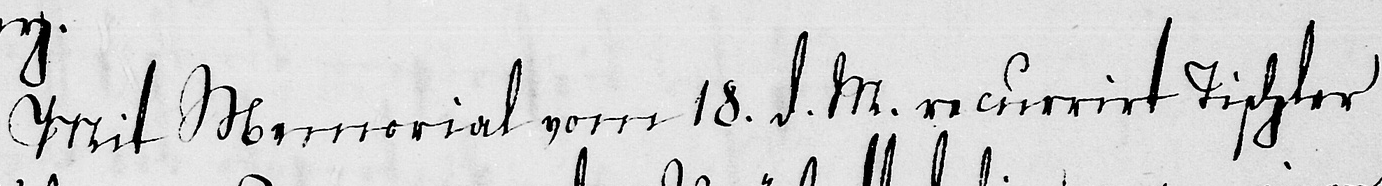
Mit Memorial vom 18. d. M. recurrirt Tischler
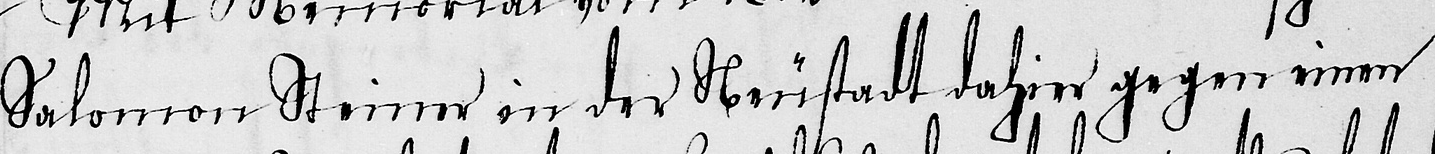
Salomon Steiner in der Neustadt dahier gegen einen
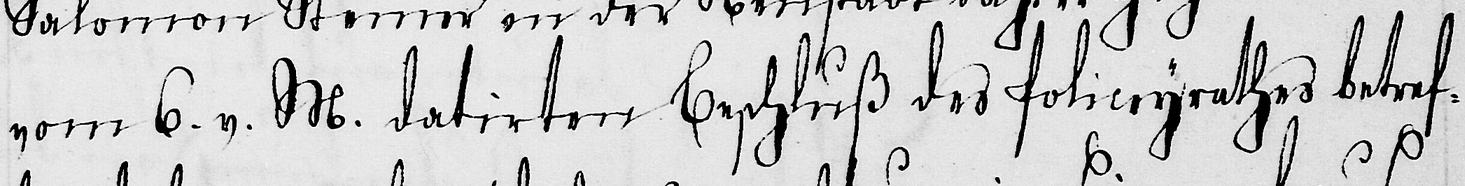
vom 6. v. M. datirten Beschluß des Policeyrathes betref¬
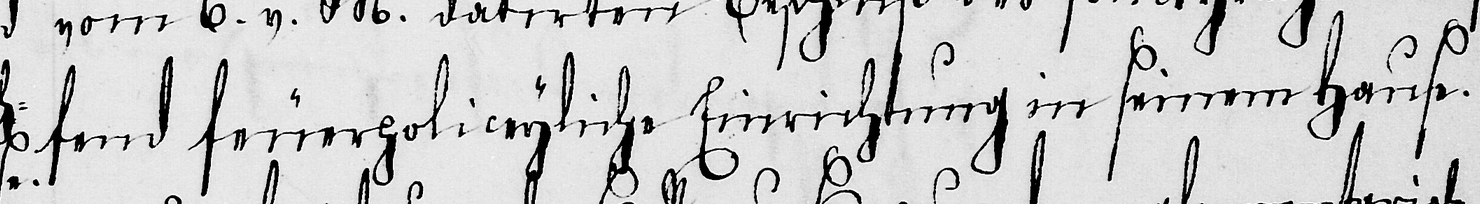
fend feuerpoliceyliche Einrichtung in seinem Hause.
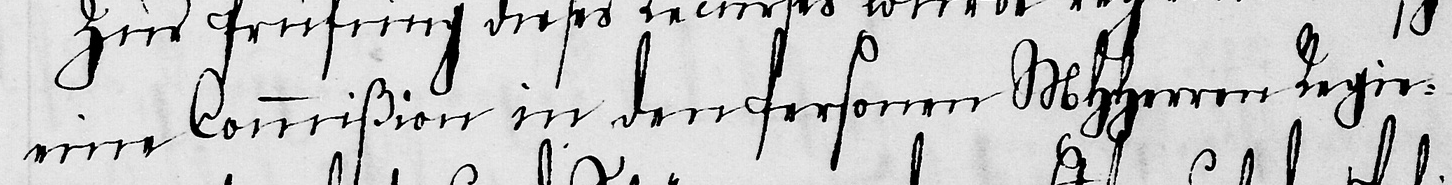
eine Commißion in den Personen MHHerren Regie¬
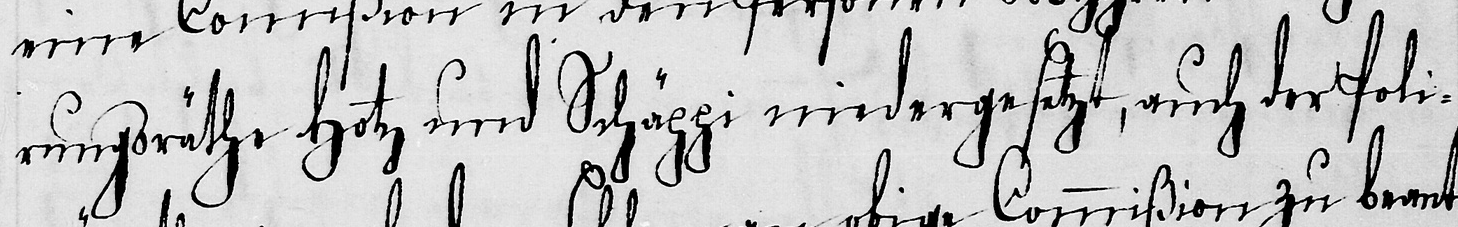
rungsräthe Hotz und Schäppi niedergesetzt, auch der Po¬
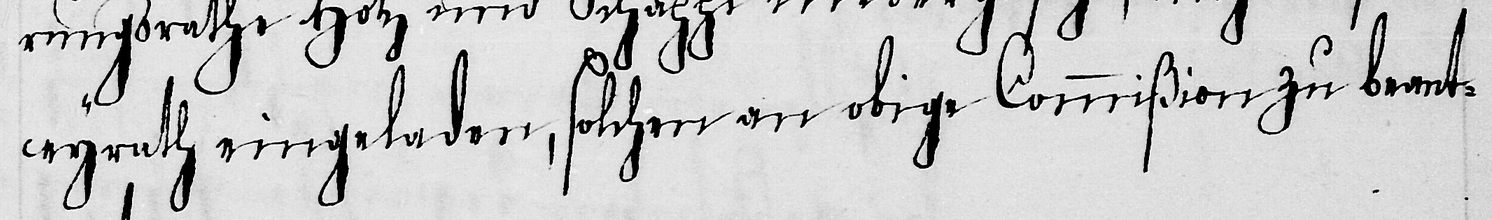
ceyrath eingeladen, solchen an obige Commißion zu beant¬
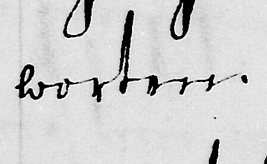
worten.
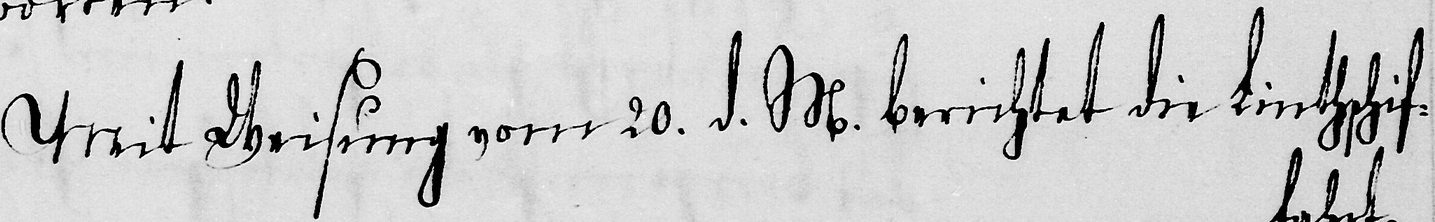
Mit Weisung vom 20. d. M. berichtet die Linth¬
